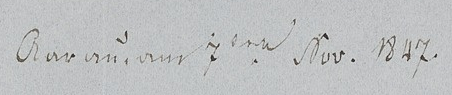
Aarau, am 7ten Nov. 1847.
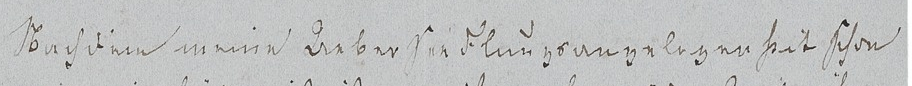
Nachdem meine Uebersiedlungsangelegenheit schon
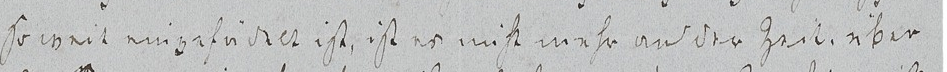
so weit eingefädelt ist, ist es nicht mehr an der Zeit, über
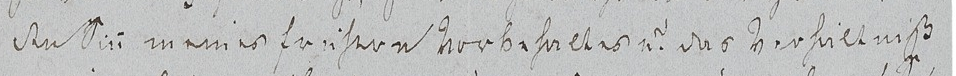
den Sinn meines frühern Vorbehaltes u. das Verhältniß
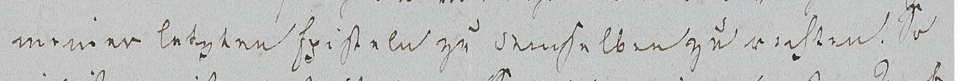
meiner letzten Episteln zu denselben zu rechten. So
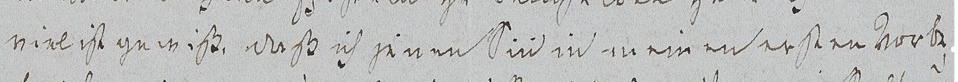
viel ist gewiß, daß ich jenen Sinn in meinen ersten Vorbe-
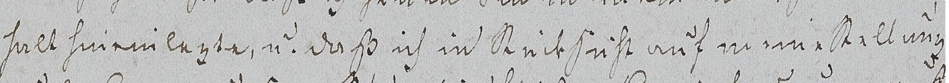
halt hineinlegte, u. daß ich in Rücksicht auf meine Stellung
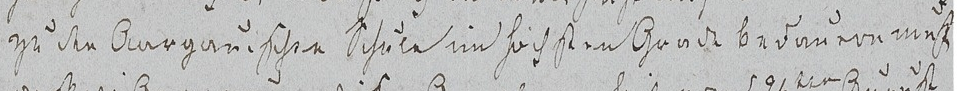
zu der Aargauischen Schule im höchsten Grade bedauern mußte,
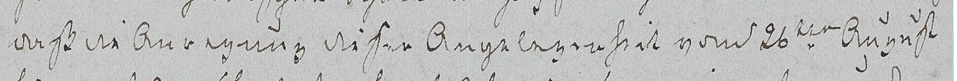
daß die Anregung dieser Angelegenheit vom 26ten August
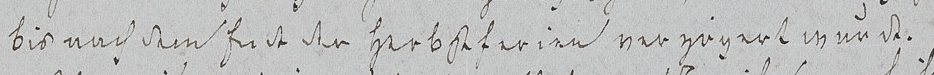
bis nach dem Ende der Herbstferien verzögert wurde.
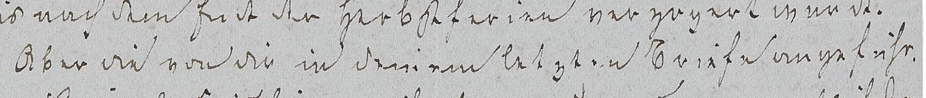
Aber die von dir in deinem letzten Briefe angeführ-
